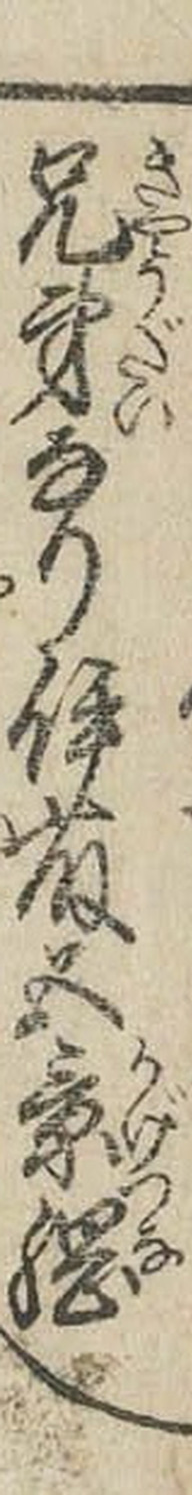兄弟なり伊藤五景綱
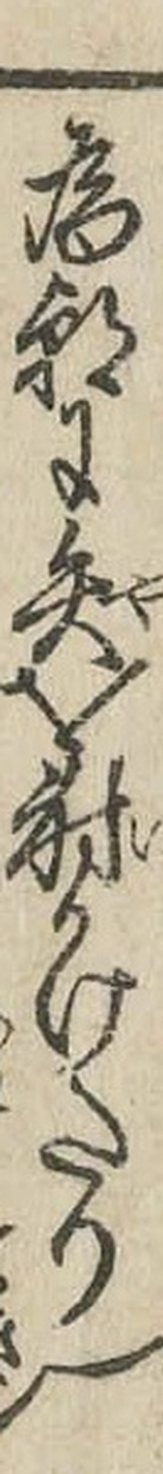為朝に矢を射かけたり
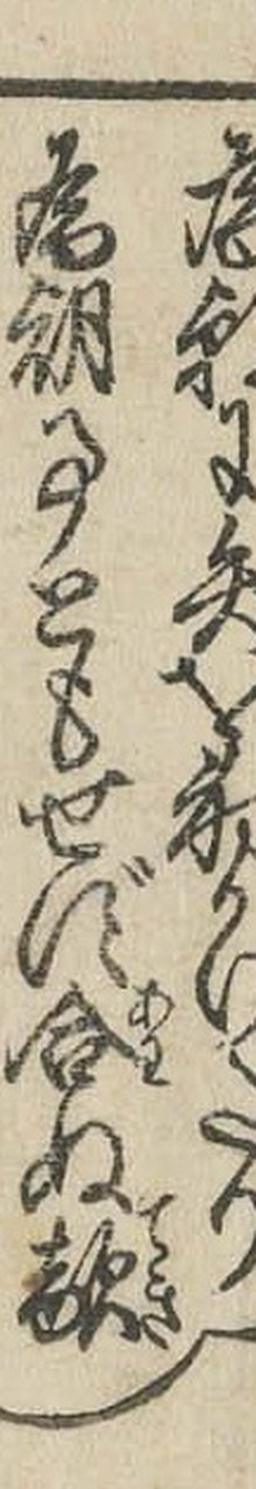為朝事ともせず合ぬ敵
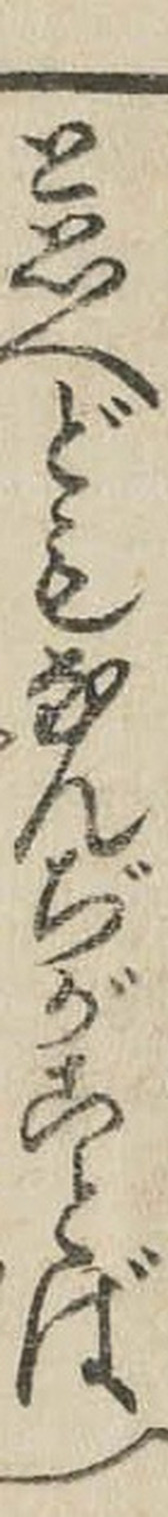と思へどもなんぢがことば
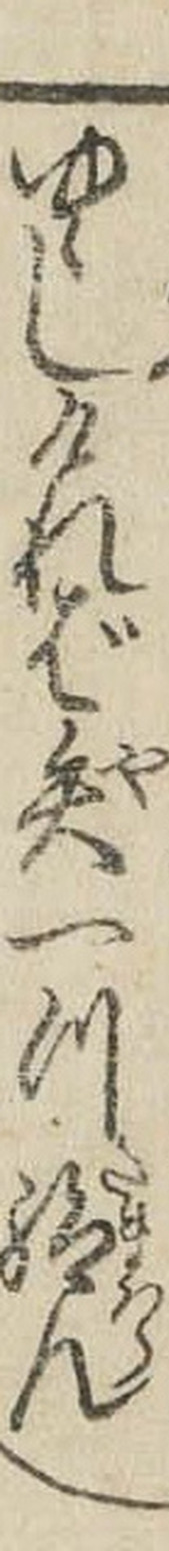ゆゝしければ矢一つ給ん
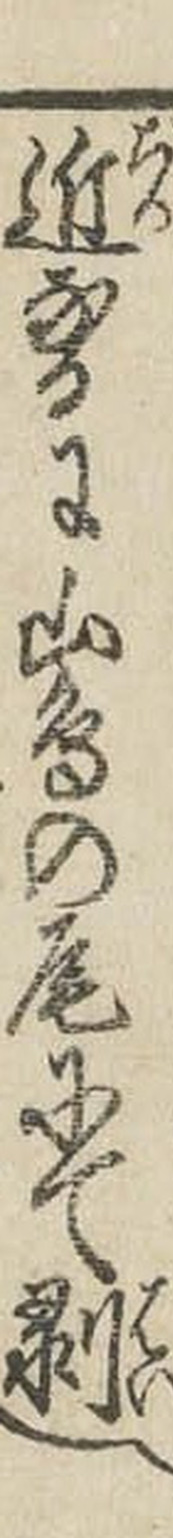近なるに山鳥の尾にて剥
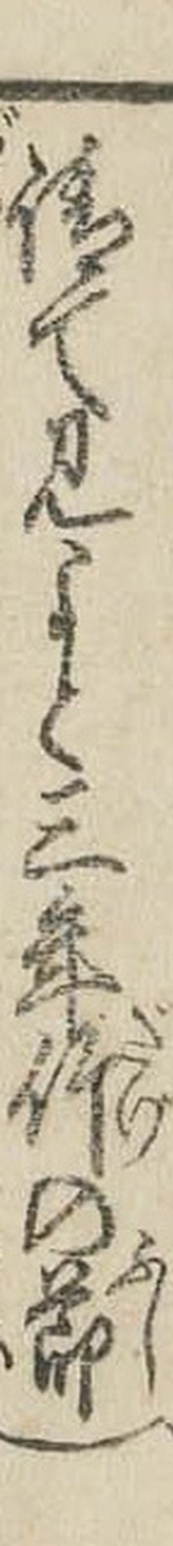請て見よと三年竹の節
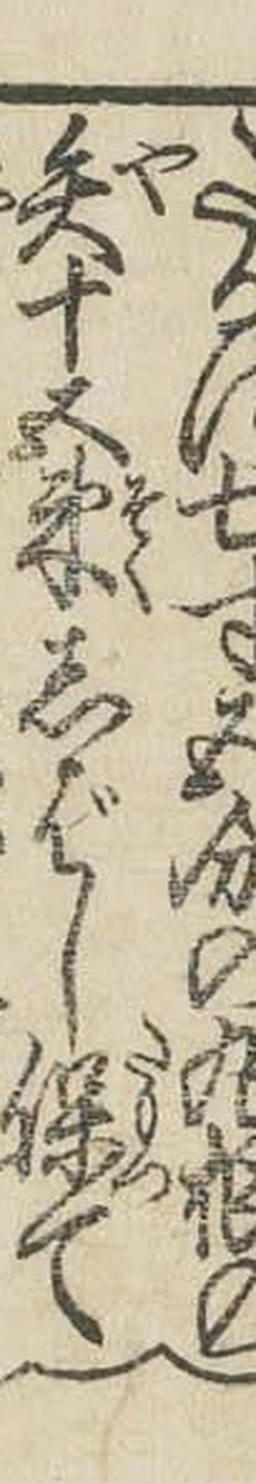矢十五束しばし保て
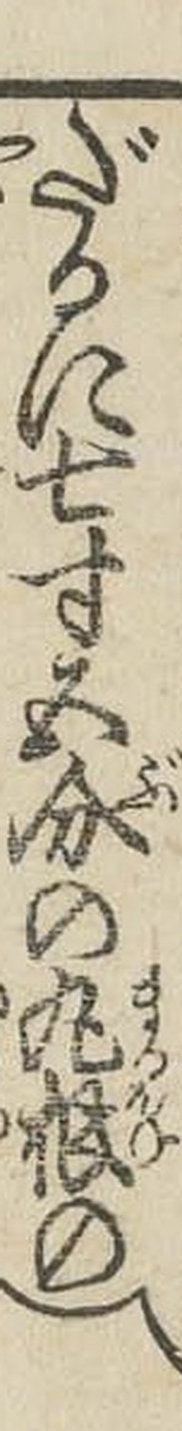だるに七寸五分の丸根の
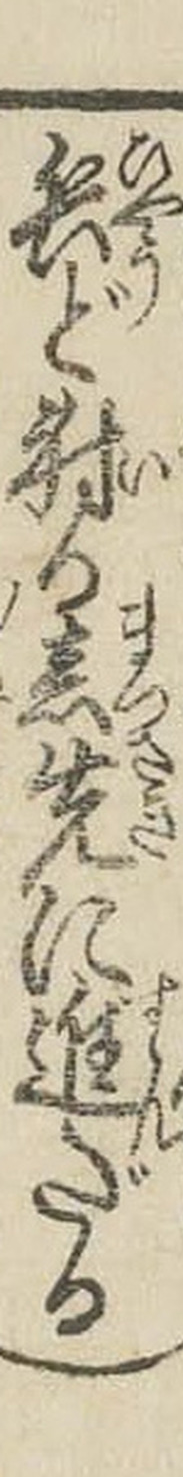兵ど射る真先に進だる
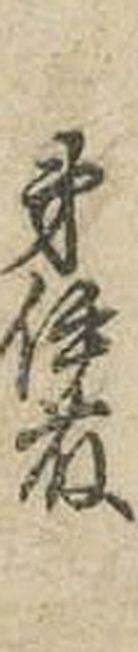弟伊藤
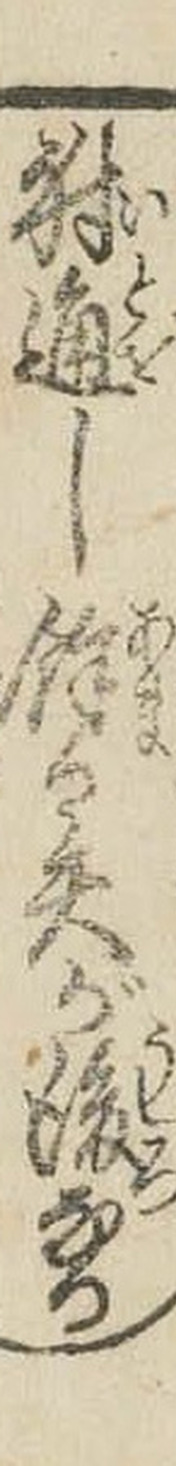射通し余る矢が後なる
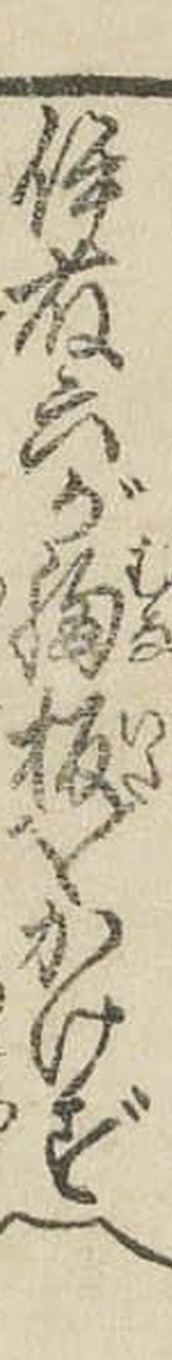伊藤六が胸板をかけず
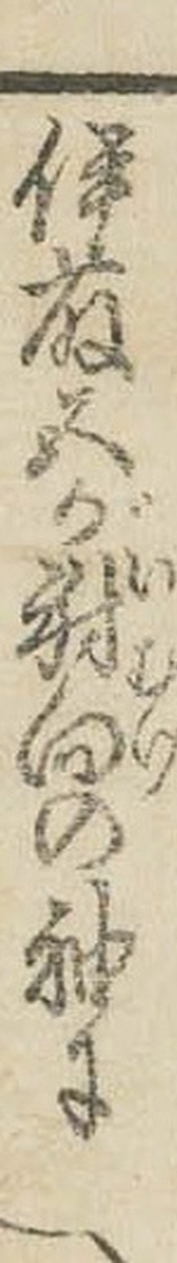伊藤五が射向の袖に
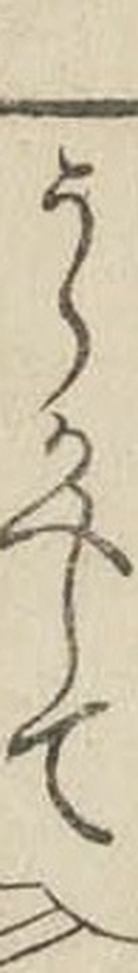うらかへして
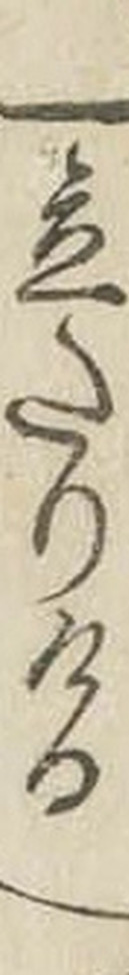立たりける
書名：絵本写宝袋 9巻 3之巻
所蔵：東京学芸大学教育コンテンツアーカイブ
